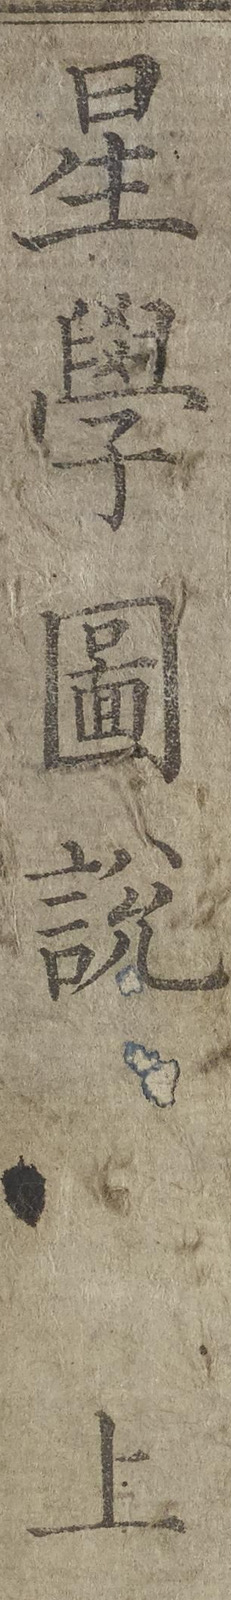星学図説上

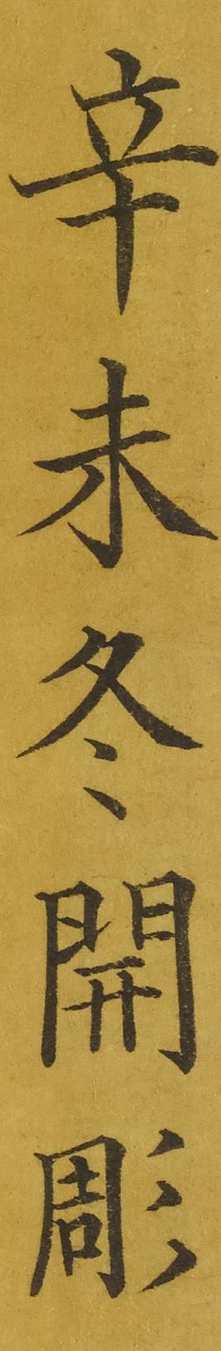辛未冬開彫
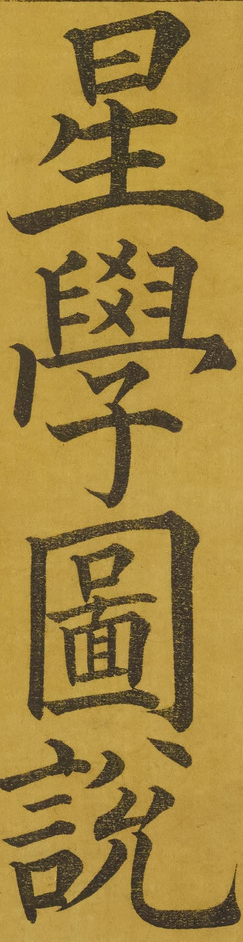星学図説
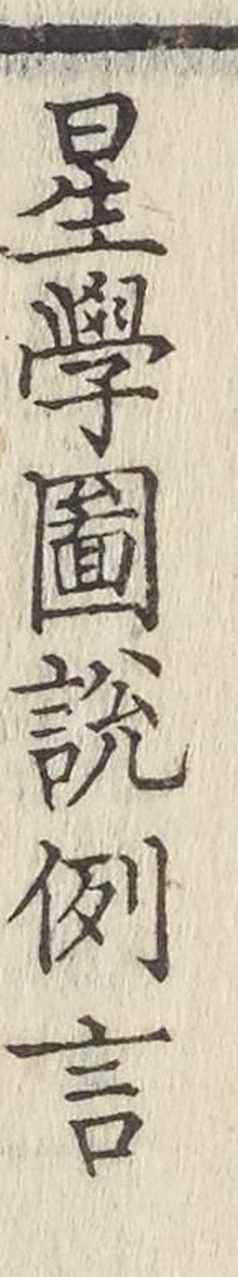星学図説例言
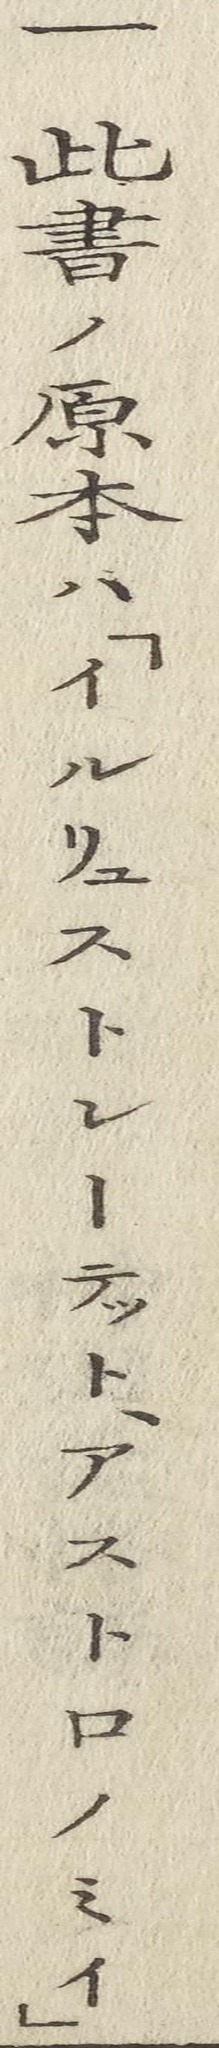一此書ノ原本ハ「イルリュストレーテット、アストロノミイ」
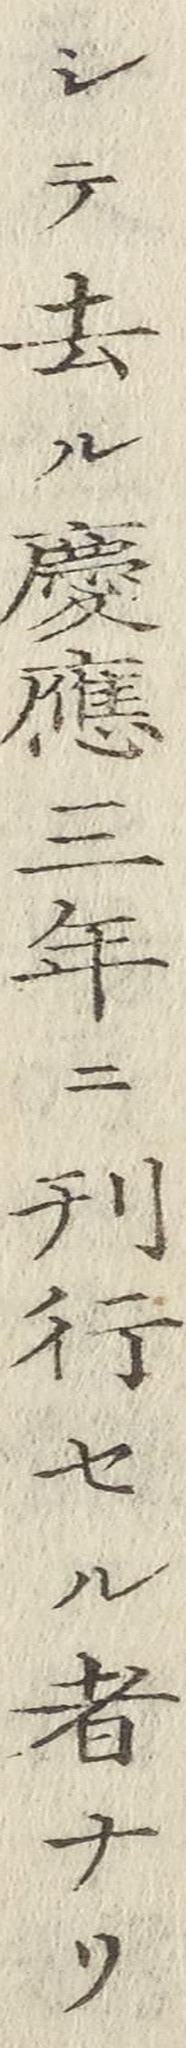シテ去ル慶応三年ニ刊行セル者ナリ
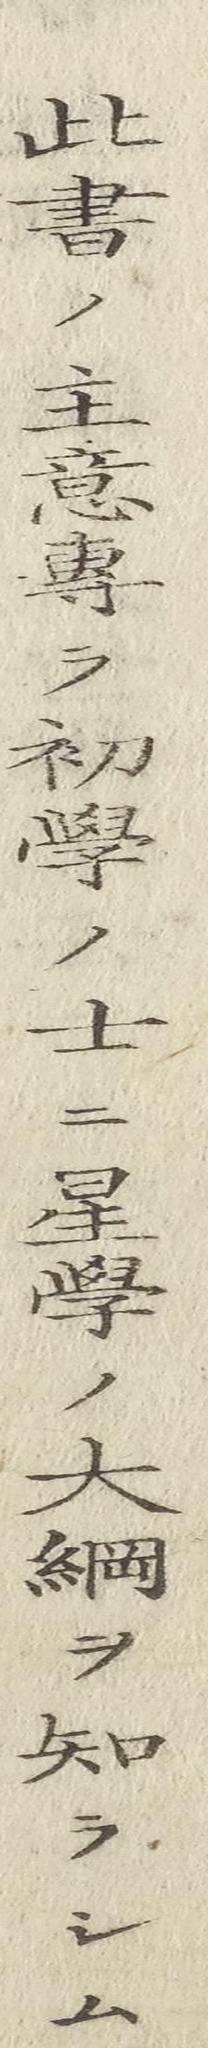一此書ノ主意専ラ初学ノ士ニ星学ノ大綱ヲ知ラシム
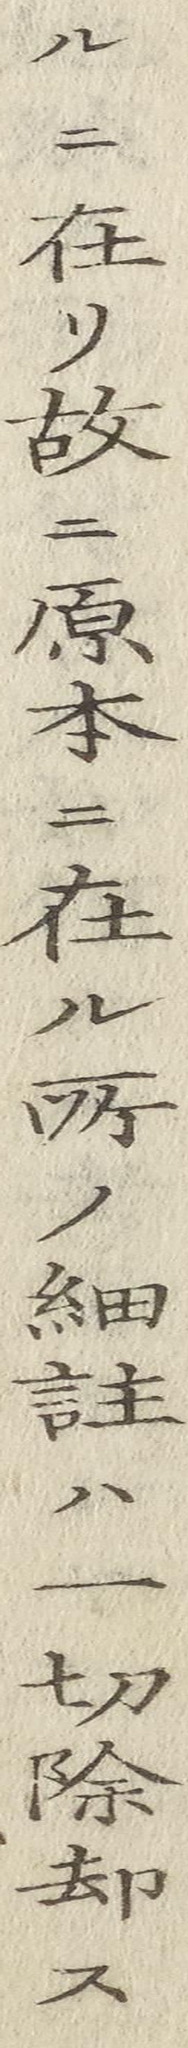ルニ在リ故ニ原本ニ在ル所ノ細註ハ一切除却ス
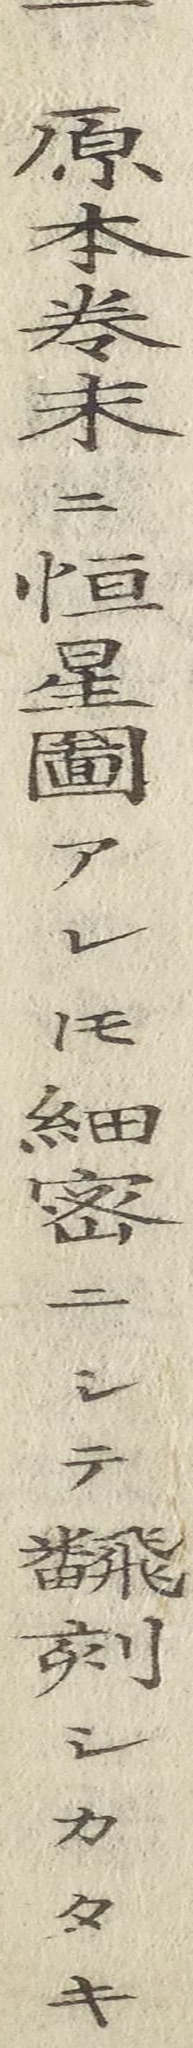一原本巻末ニ恒星図アレトモ細密ニシテ翻刻シカタキ
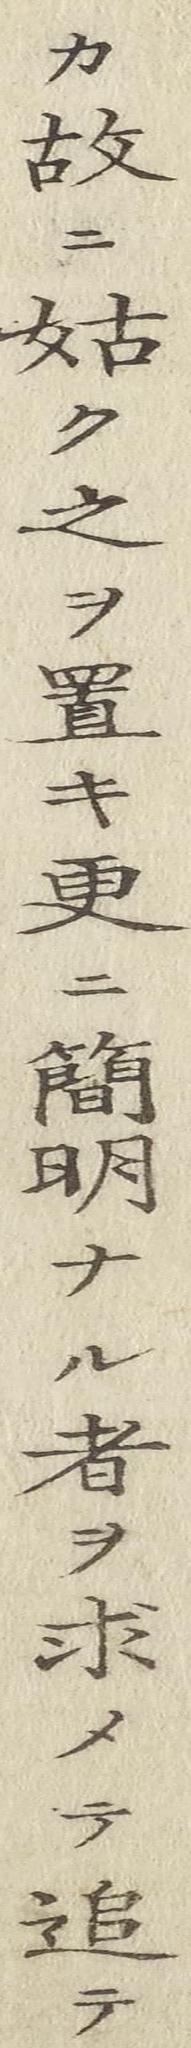カ故ニ姑ク之ヲ置キ更ニ簡明ナル者ヲ求メテ追テ
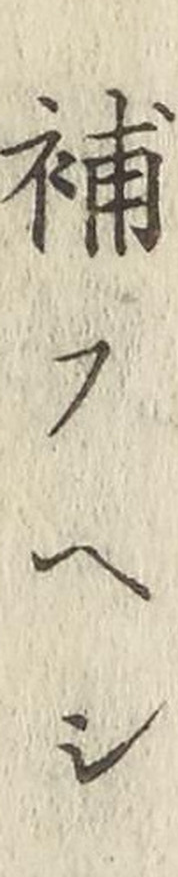補フヘシ
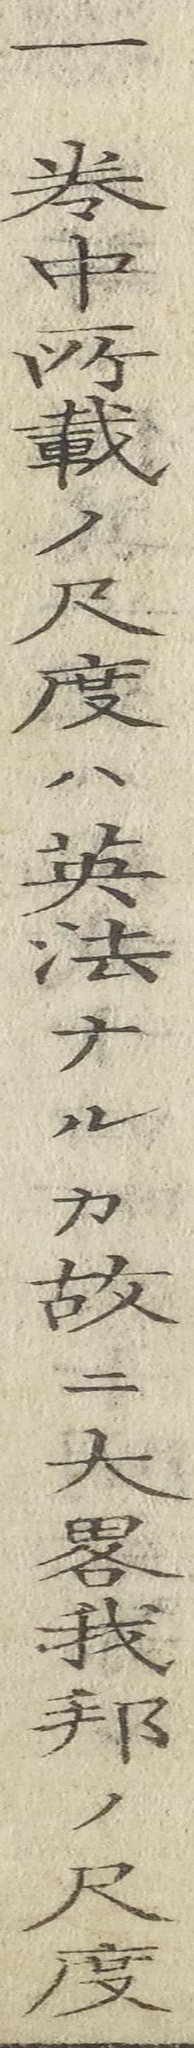一巻中所載ノ尺度ハ英法ナルカ故ニ大略我邦ノ尺度

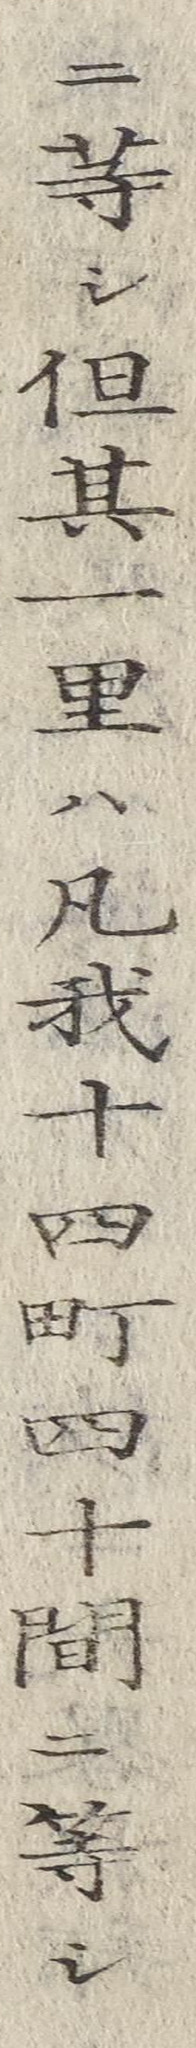ニ等シ但其一里ハ凡我十四町四十間ニ等シ
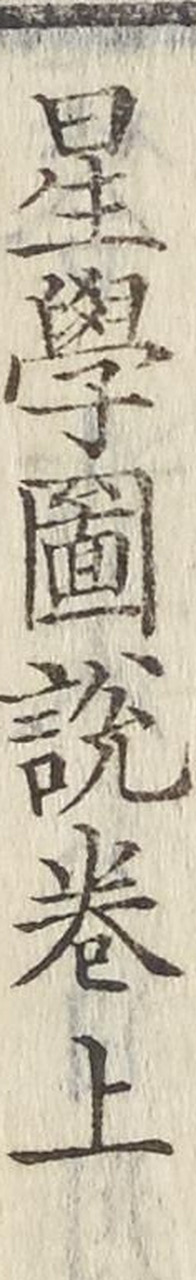星学図説巻上
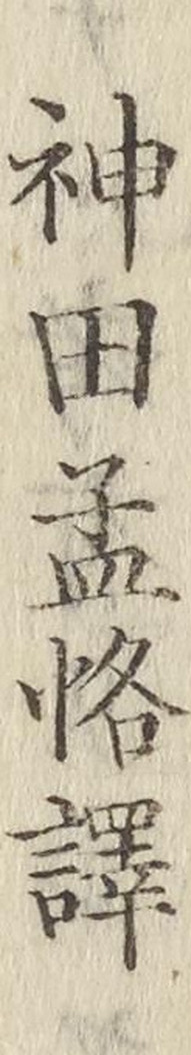神田孟恪訳
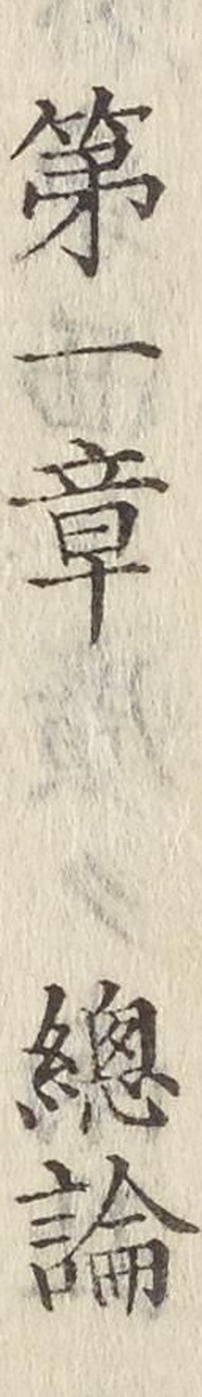第一章総論
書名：星学圖説　上
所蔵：東京大学地震研究所図書室 Earthquake Research Institute Library, The University of Tokyo, JAPAN
